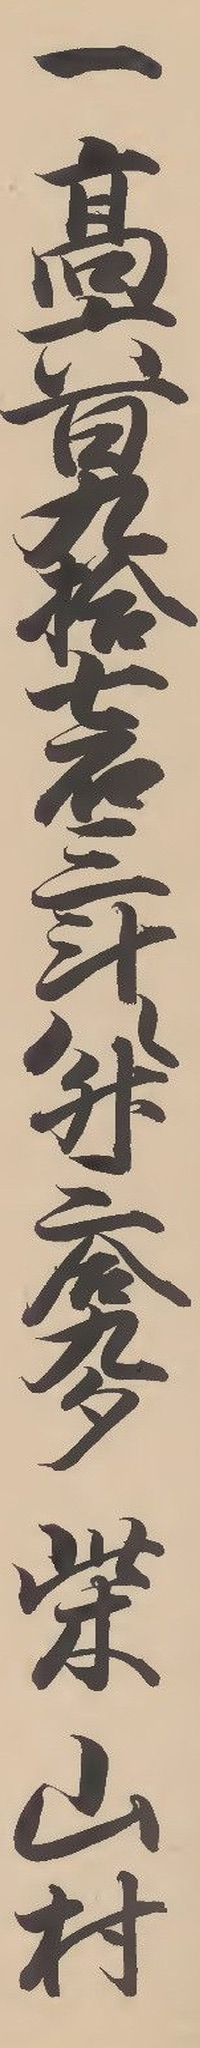一高六百九拾七石三斗八升三合九勺柴山村
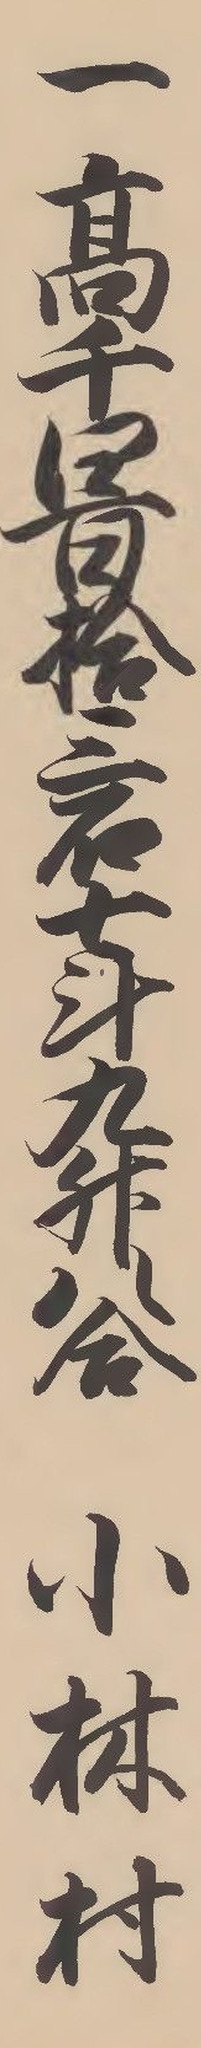一高千四百拾三石七斗九升八合小林村
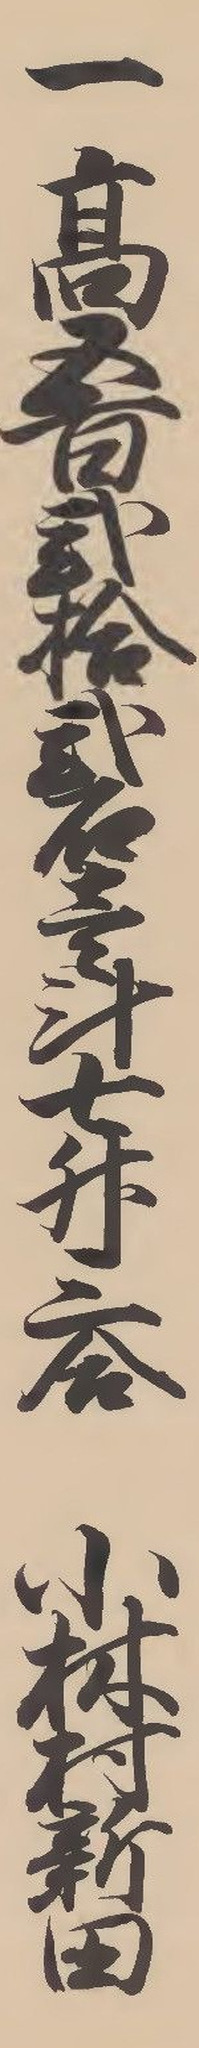一高五百弐拾弐石壱汁七升三合小林村新田
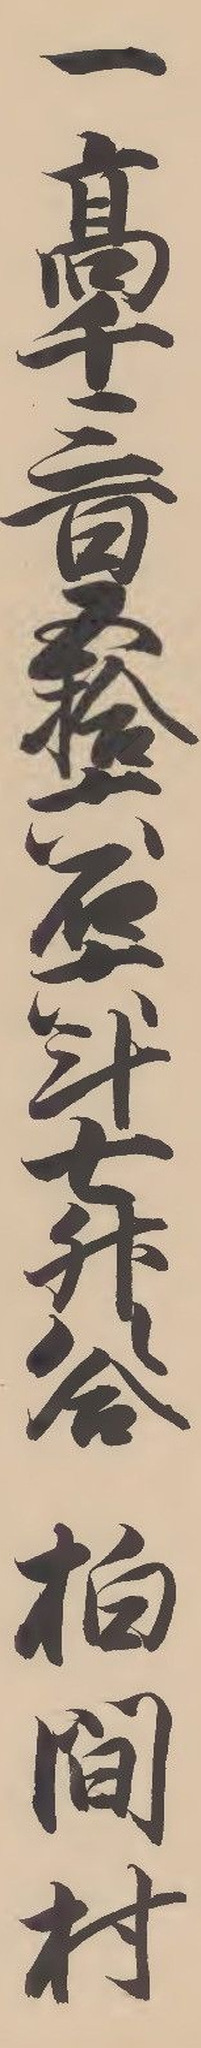一高千三百五拾六石六斗七升八合栢間村

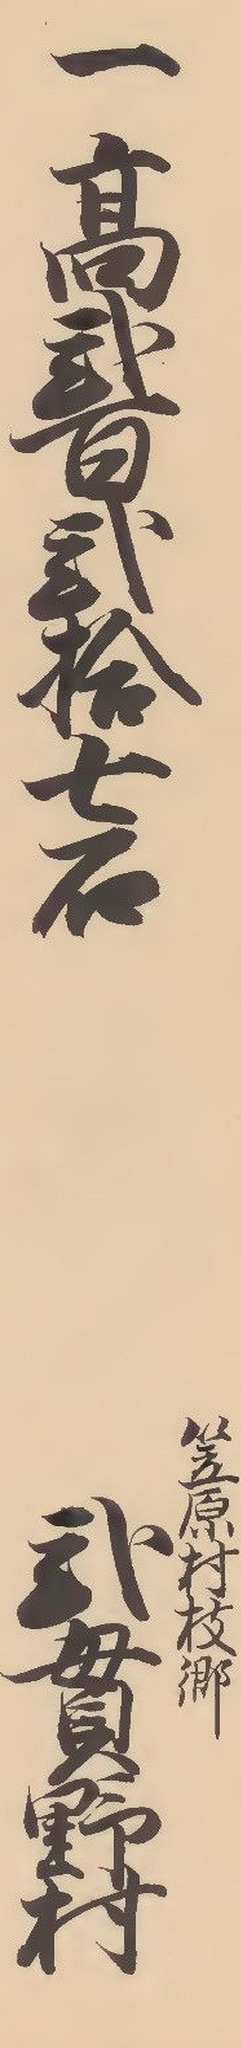一高弐百弐拾七石弐貫野村
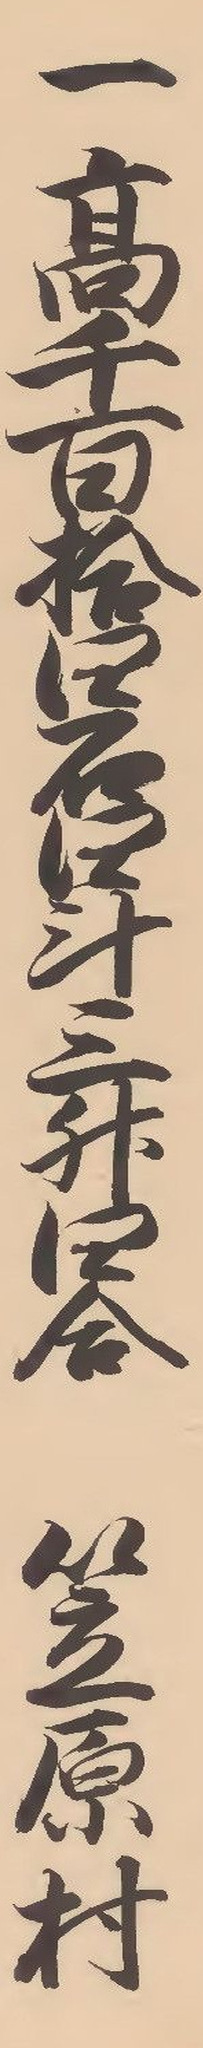一高千百拾四石四斗三升四合笠原村
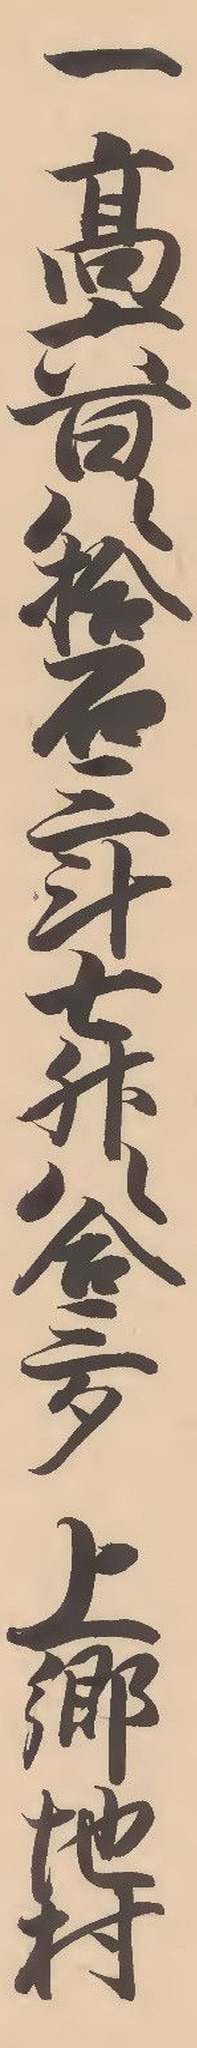一高六百八拾石三斗七升八合三勺上郷地村
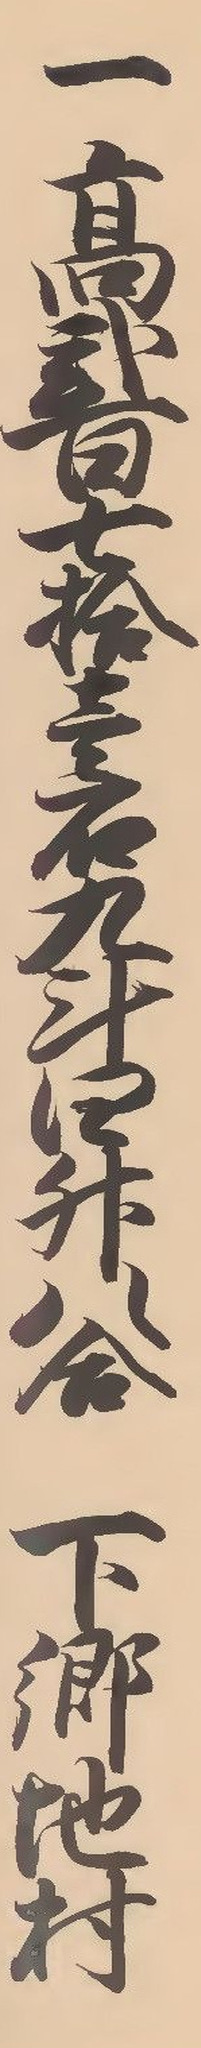一高弐百七拾壱石九斗四升八合下郷地村
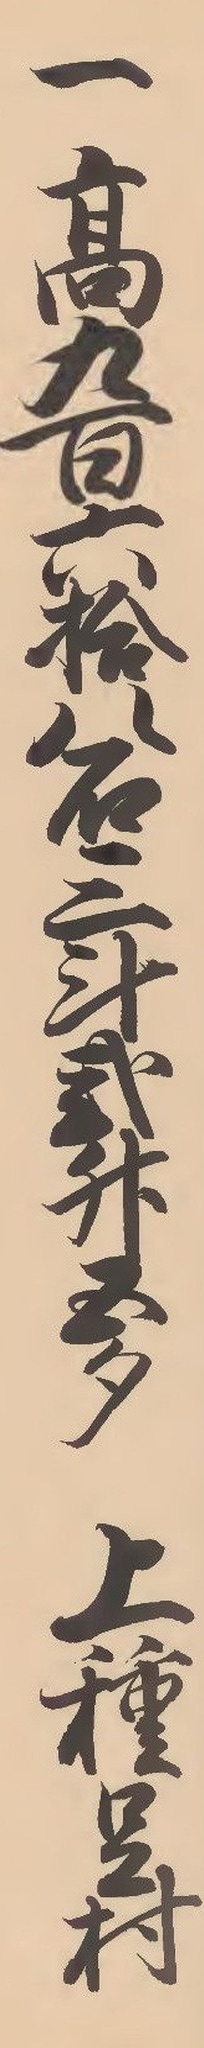一高九百六拾八石三斗弐升五勺上種足村
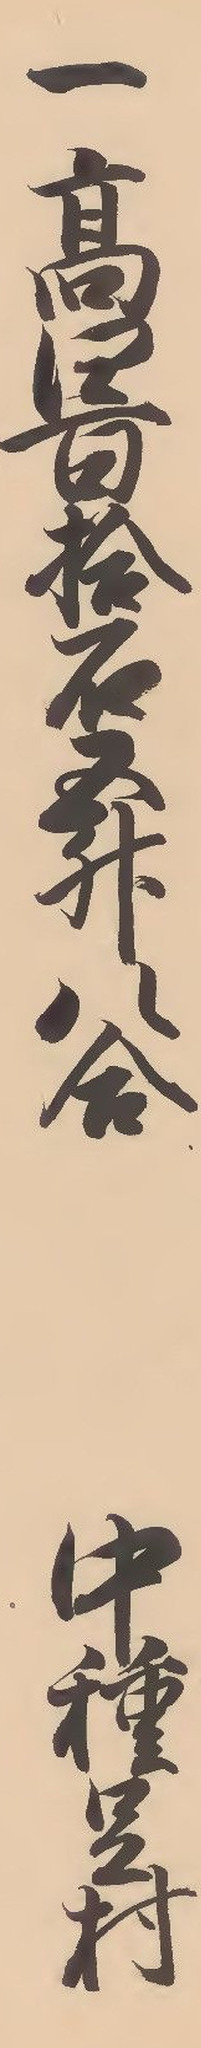一高四百拾石五升八合中種足村
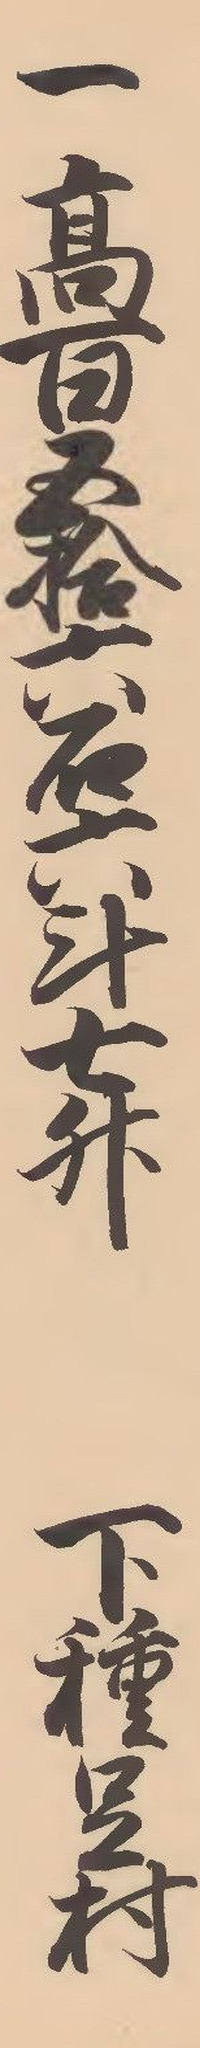一高百五拾六石六斗七升下種足村
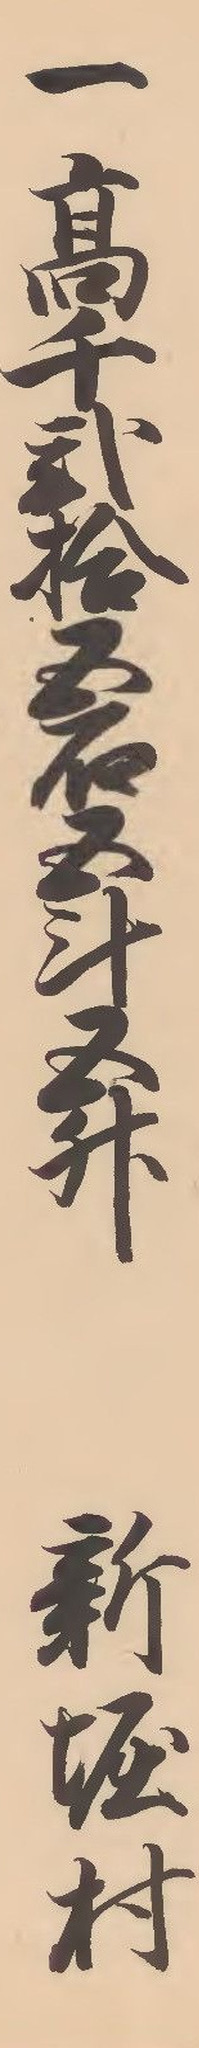一高千弐拾五石五斗五升新堀村

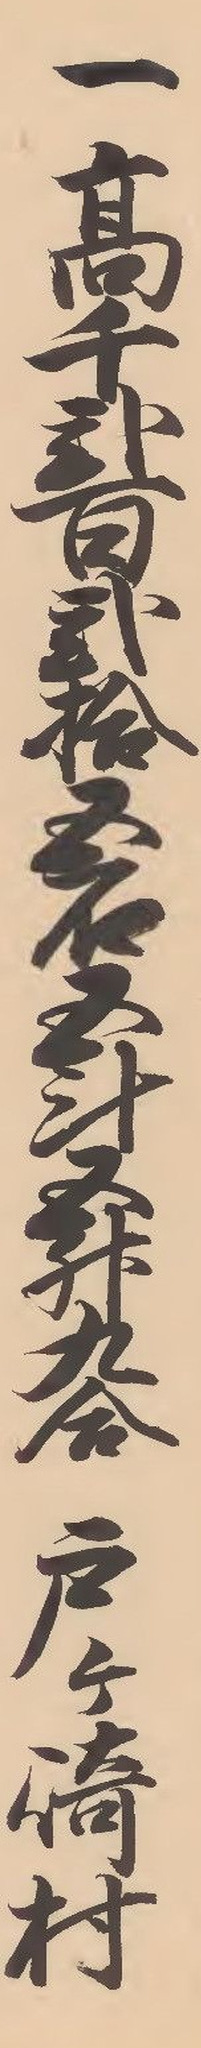一高千弐百弐拾五石五斗五升九合戸ヶ崎村
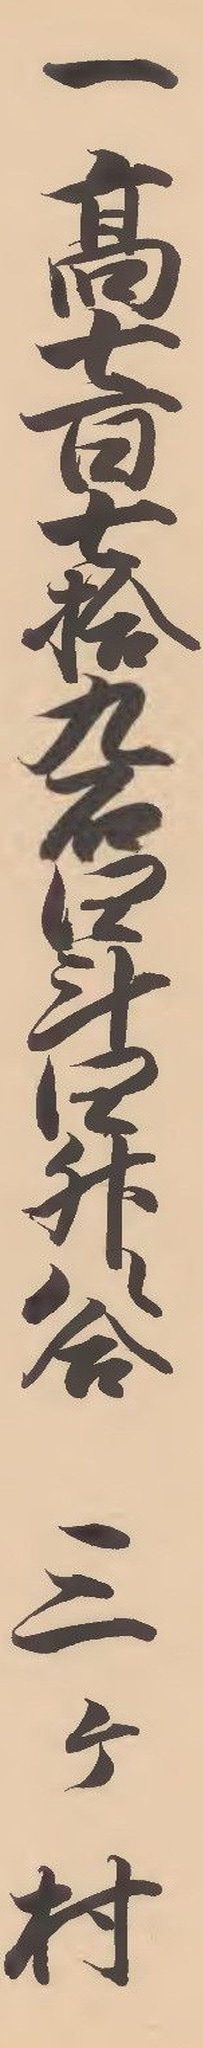一高七百七拾九石四斗四升八合三ヶ村
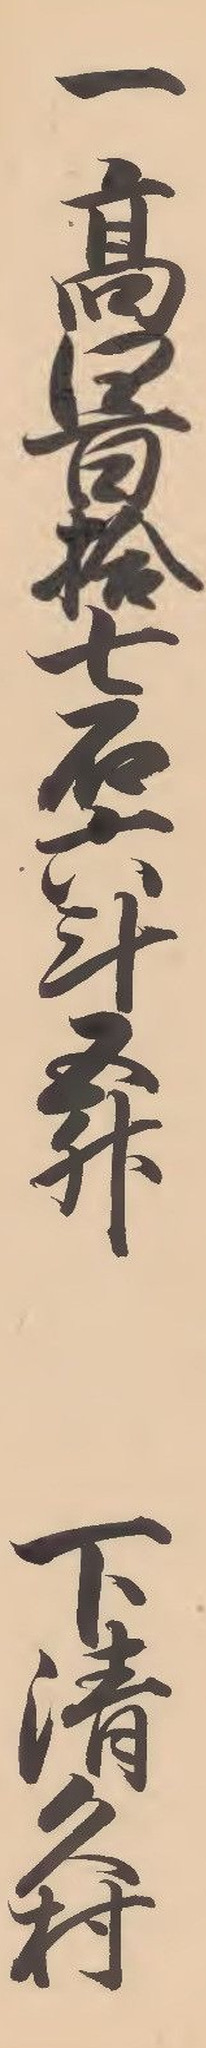一高四百拾七石六斗五升下清久村
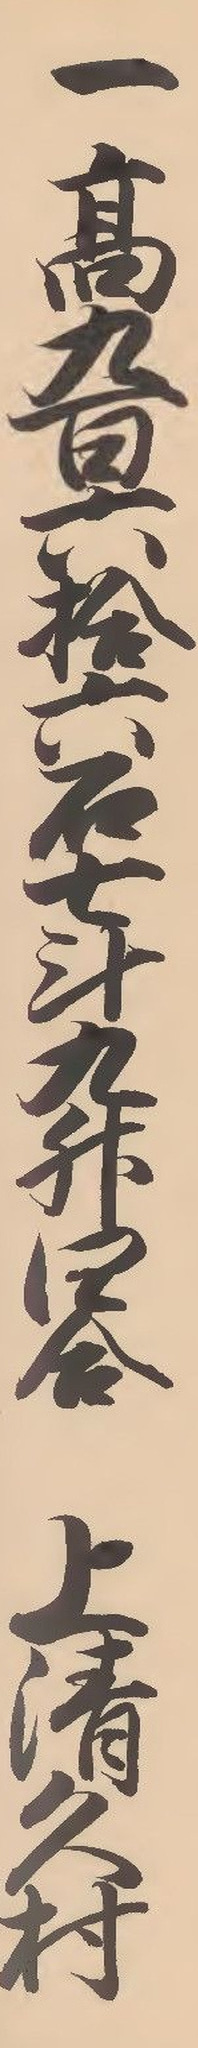一高九百六拾六石七斗九升四合上清久村
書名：武蔵国郷帳　下
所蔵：国立公文書館 National Archives of Japan
